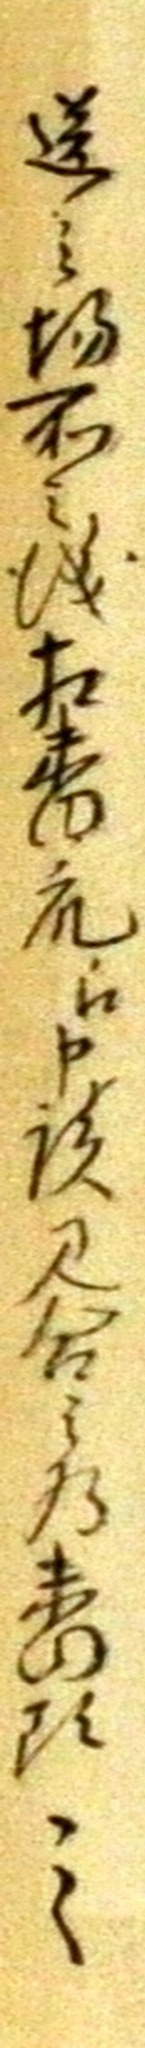送之場所之儀相番衆え申談見合之為番頭之
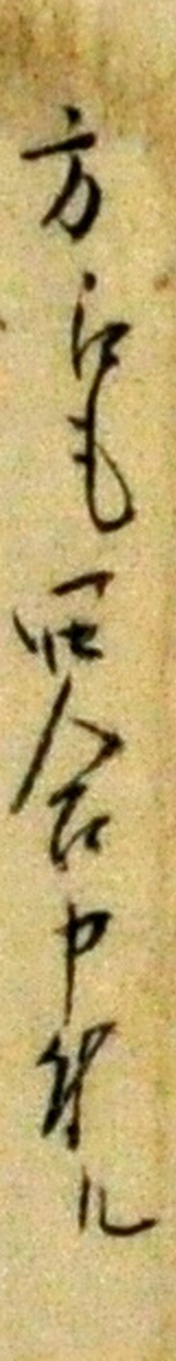方えも問合申付ル
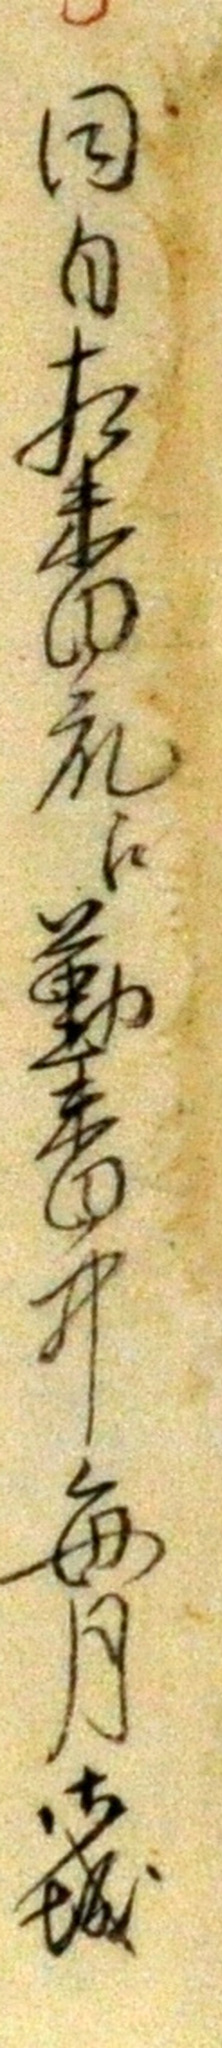同日相番衆え勤番中毎月御城
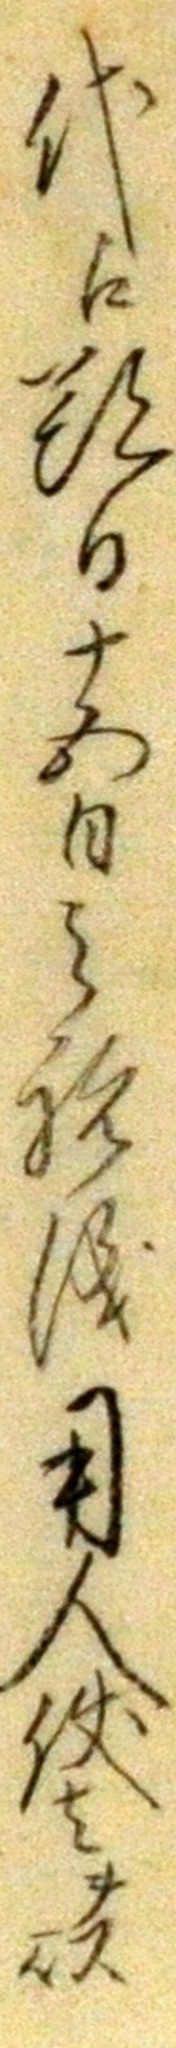代え朔日十五日之祝儀用人使者ヲ以
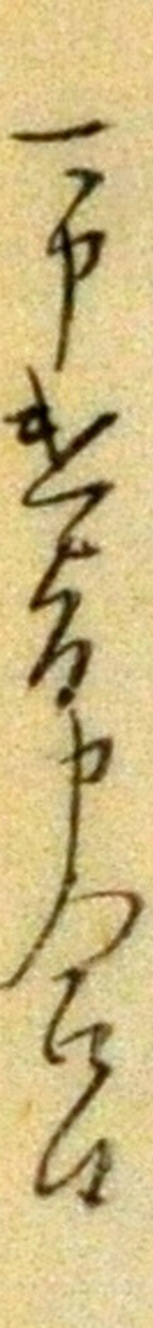可申遣旨申合候
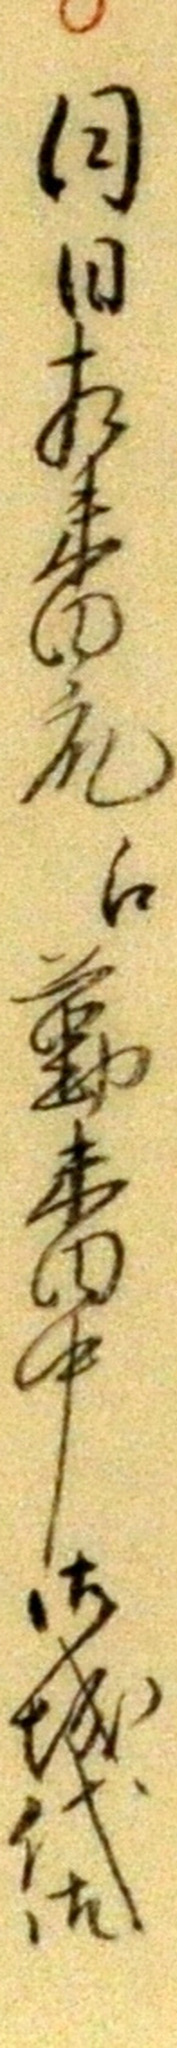同日相番衆え勤番中御城代御
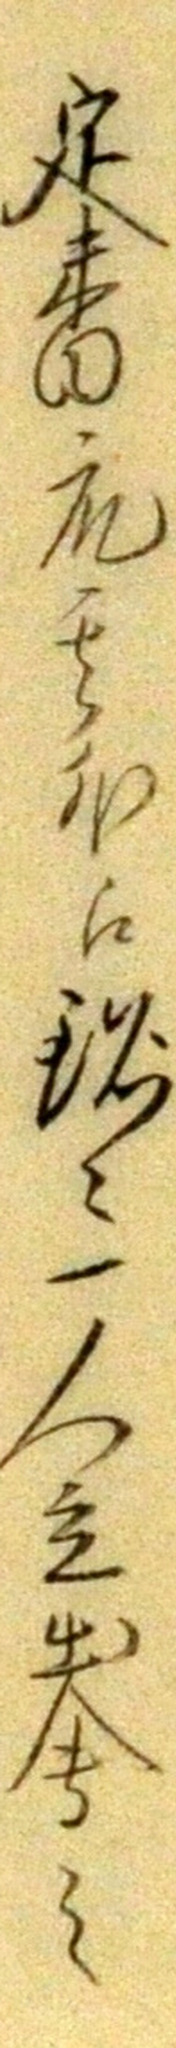定番衆其外え銘々一人立出会之
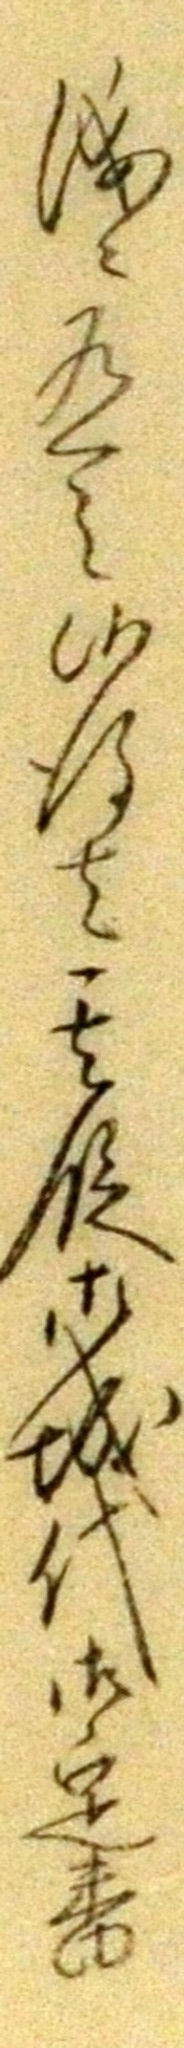儀ニ有之候得は其段御城代御定番
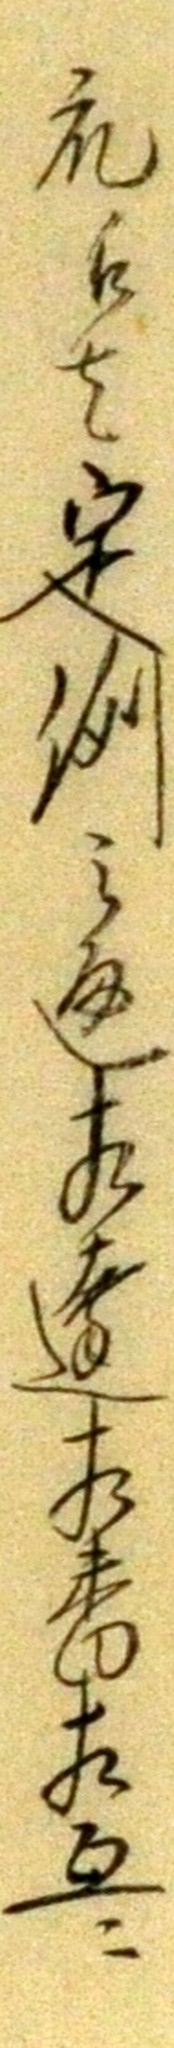衆えは定例之通相達相番相互二
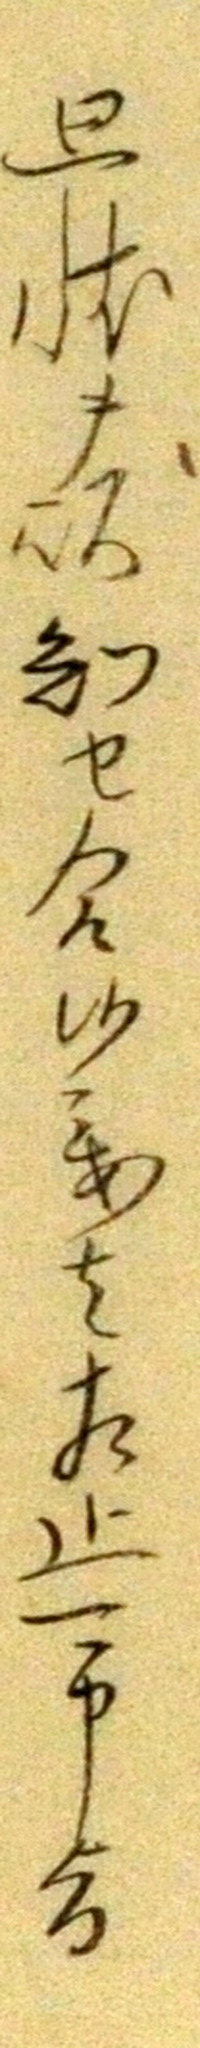廻状ヲ以知セ合候義は相止可申旨
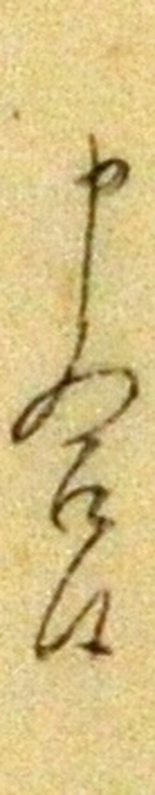申合候
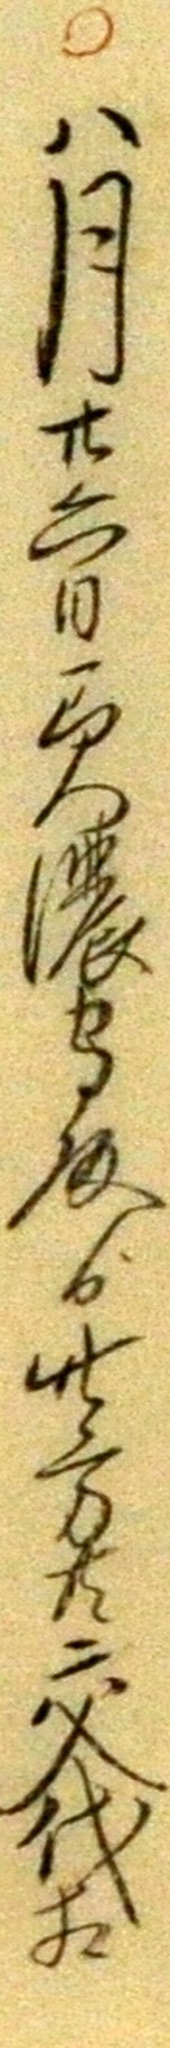八月廿六日美濃守殿ゟ此方共交代相
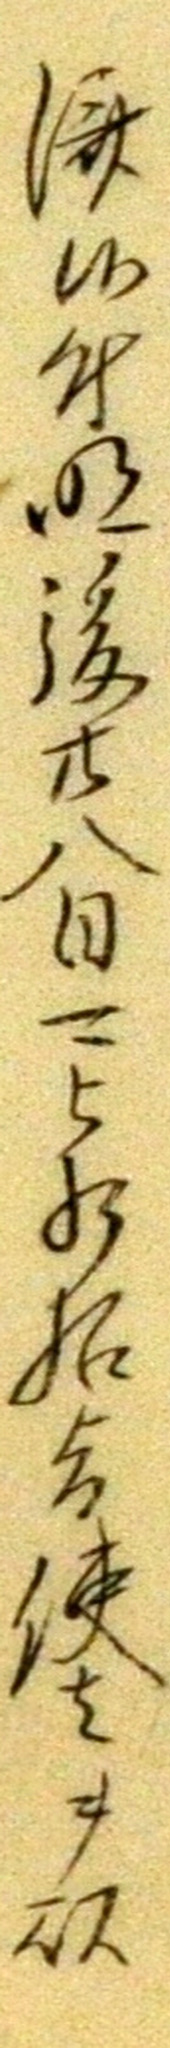済候付明後廿八日可被相招旨使者ヲ以
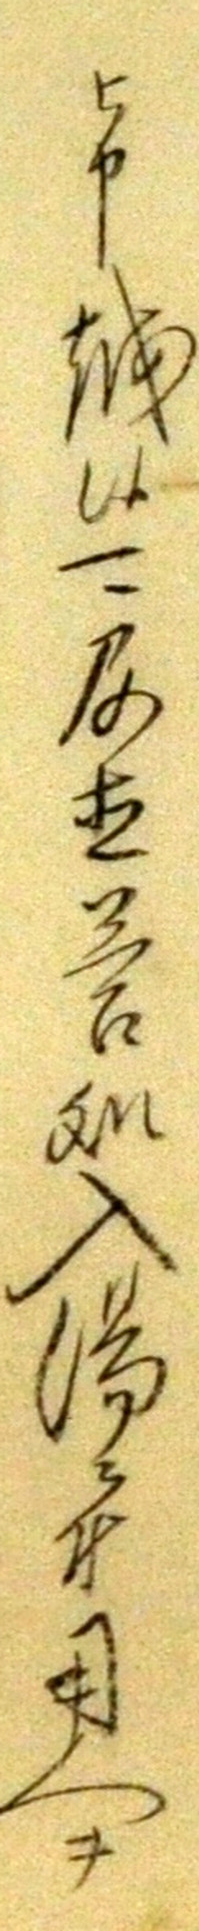被申越候可及直答処入湯二付用人ヲ
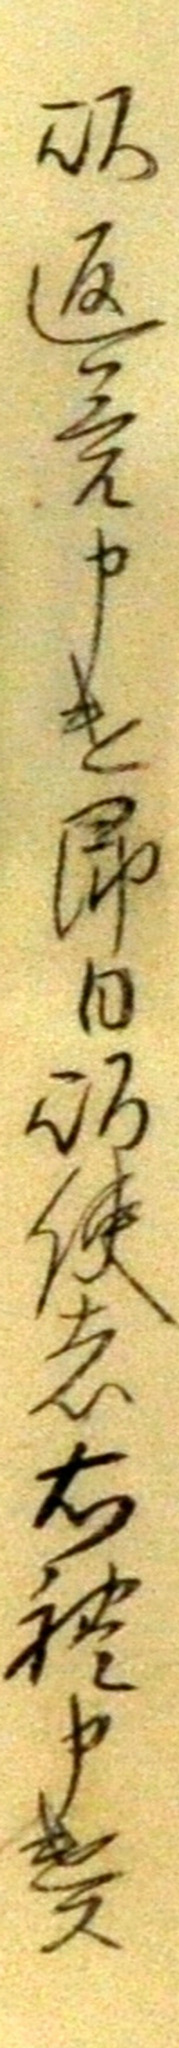以返答申遣即日以使者右禮申遣ス

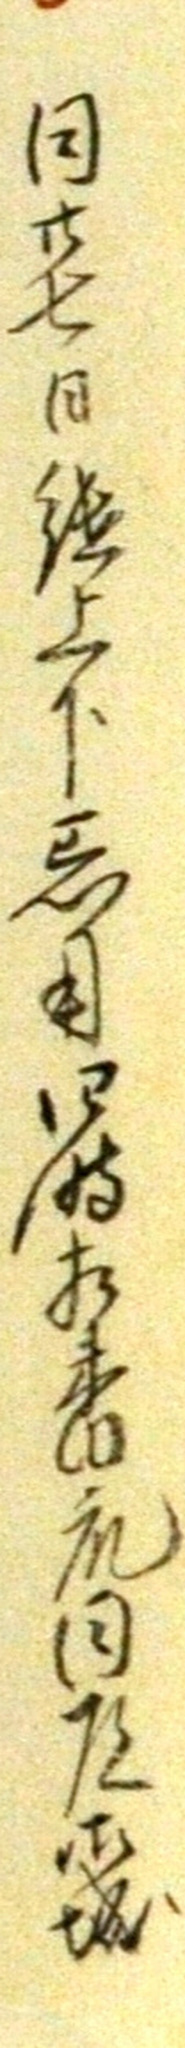同廿七日継上下着用四時相番衆同道御城
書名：大阪加番関係諸書留〔一括〕
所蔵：伊那市立高遠町図書館・合同会社AMANE
